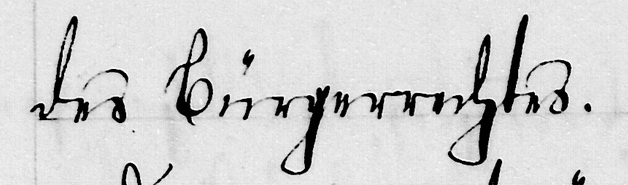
des Bürgerrechtes.
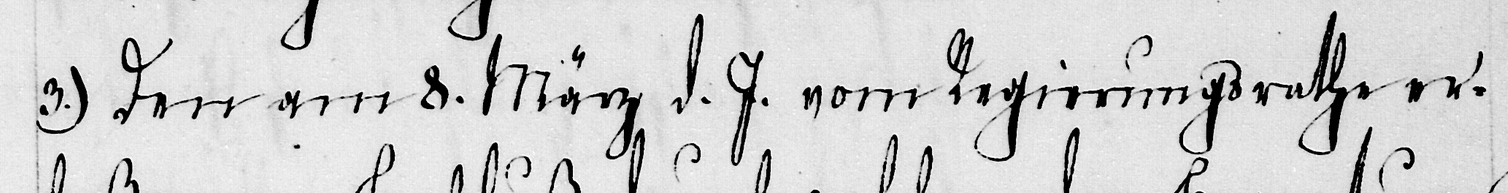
3.) Den am 8. März d. J. vom Regierungsrathe er¬
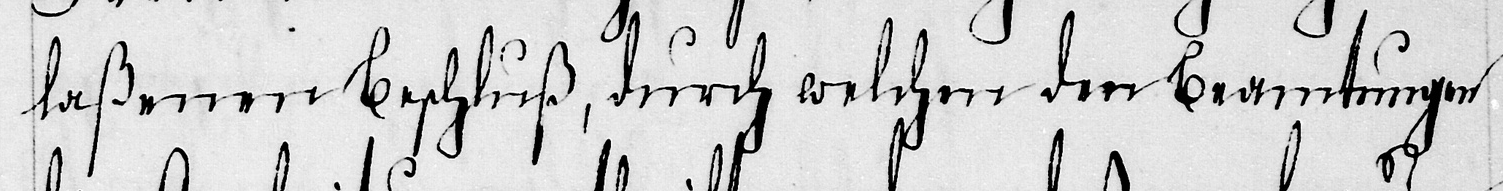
laßenen Beschluß, durch welchen den Beamtungen
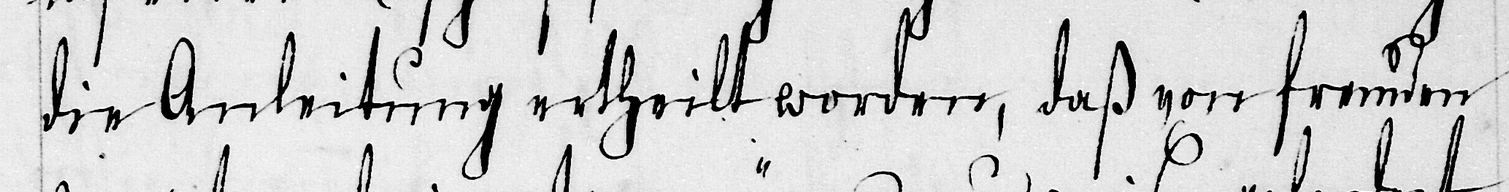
die Anleitung ertheilt worden, daß von fremden
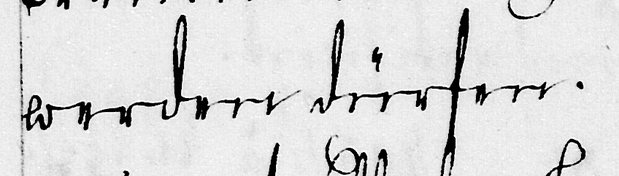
werden dürfen.
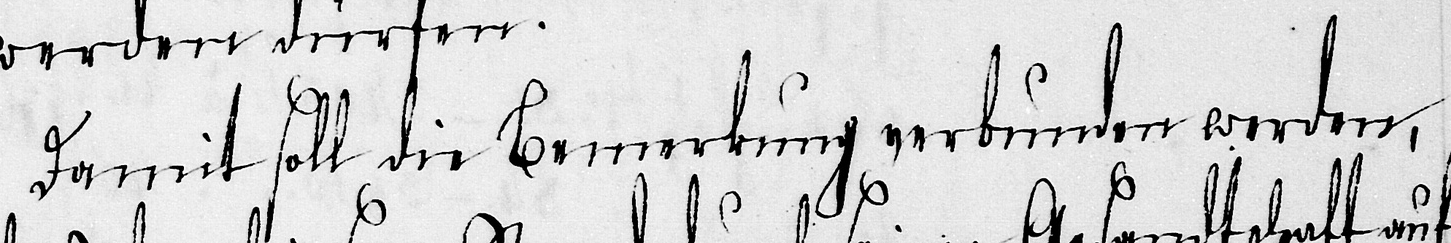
Damit soll die Bemerkung verbunden werden,
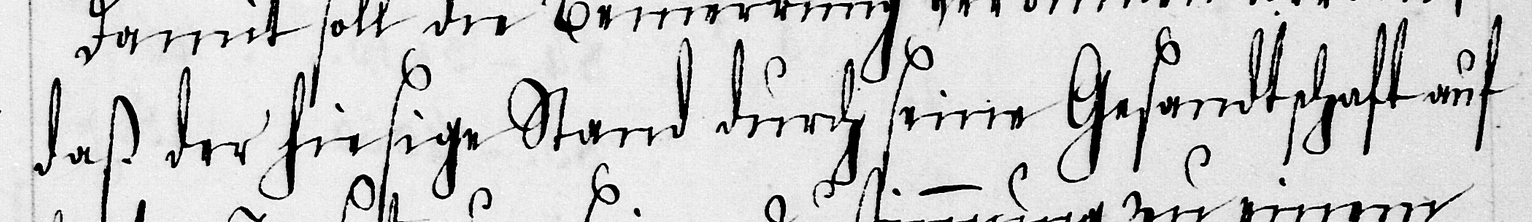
daß der hiesige Stand durch seine Gesandtschaft auf
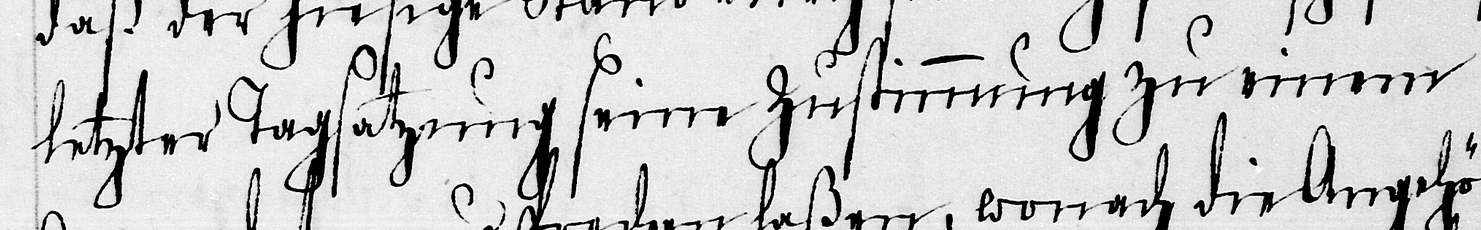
letzter Tagsatzung seine Zustimmung zu einem
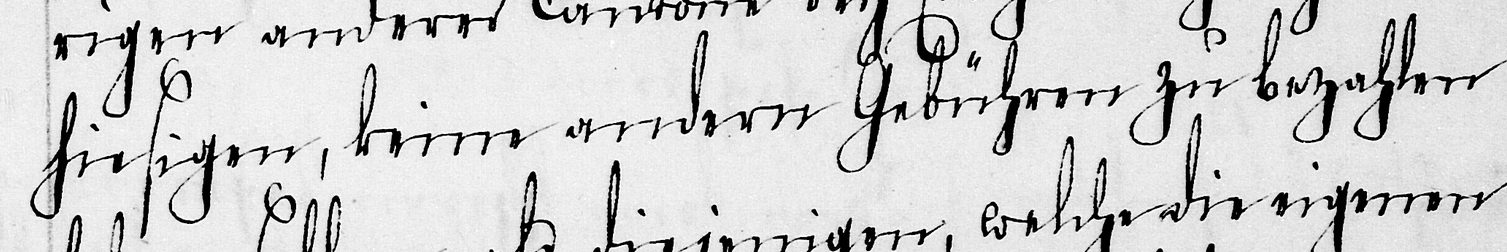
hiesigen, keine andern Gebühren zu bezahlen
